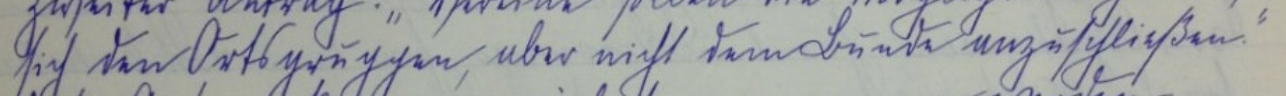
sich den Ortsgruppen, aber nicht dem Bund anzuschließen"
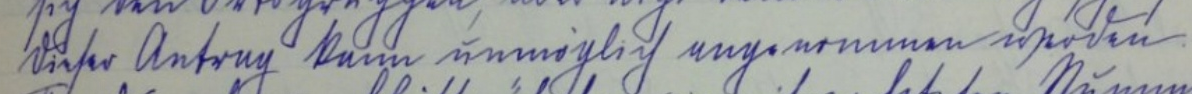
Dieser Antrag kann unmöglich angenommen werden
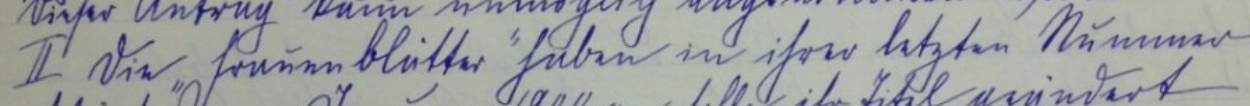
II Die „Frauenblätter" haben in ihrer letzten Nummer
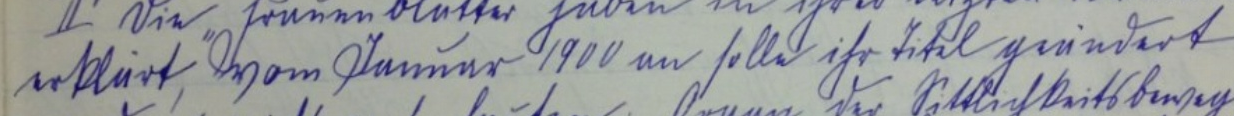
erklärt, von Januar 1900 an solle ihr Titel geändert
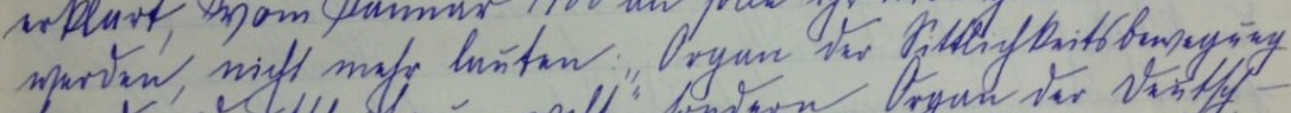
werden, nicht mehr lauten „Organ der Sittlichkeitsbewegung
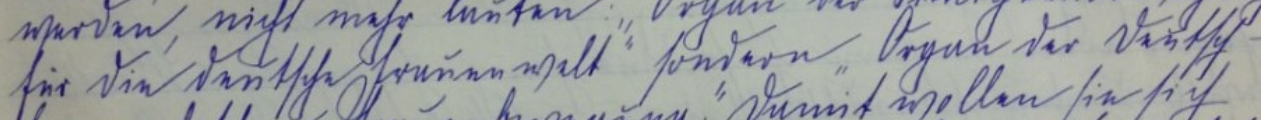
für die deutsche Frauenschaft" sondern „Organ der Deutsch-
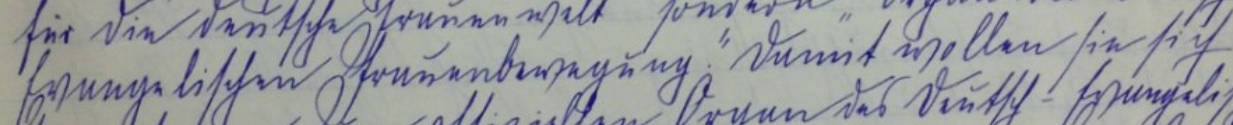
Evangelischen Frauenbewegung". Damit wollen sie sich
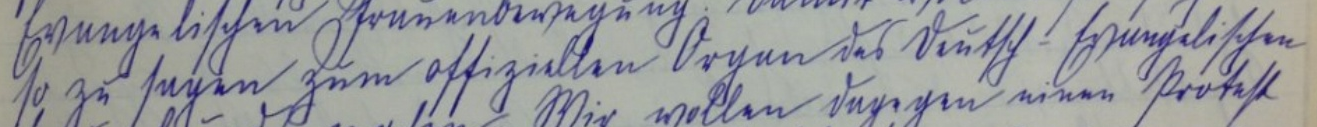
so zu sagen zum öffentlichen Organ des Deutsch Evangelischen
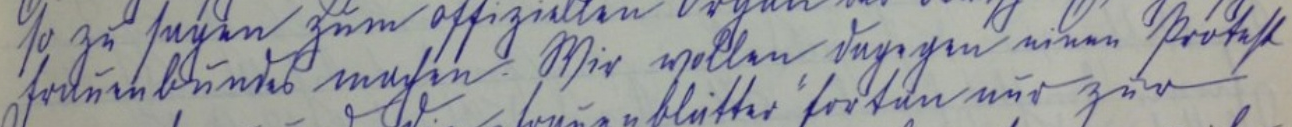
Frauenbundes machen. Wir wollen dagegen einen Protest
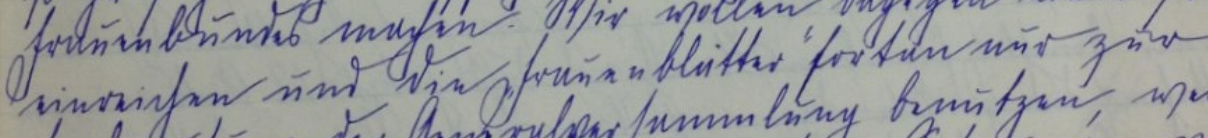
einreichen und die Frauenblätter fortan nur zur
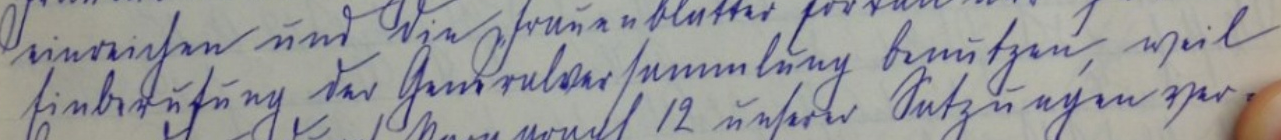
Einberufung der Generalversammlung benutzen, weil
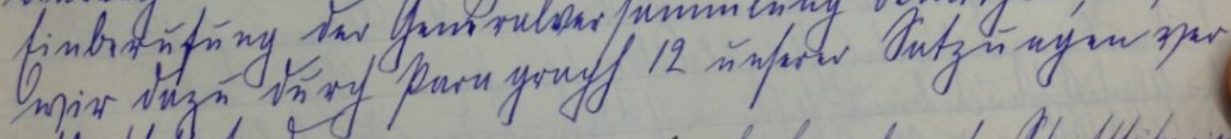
wir dazu durch Paragraph 12 unserer Satzungen ver
